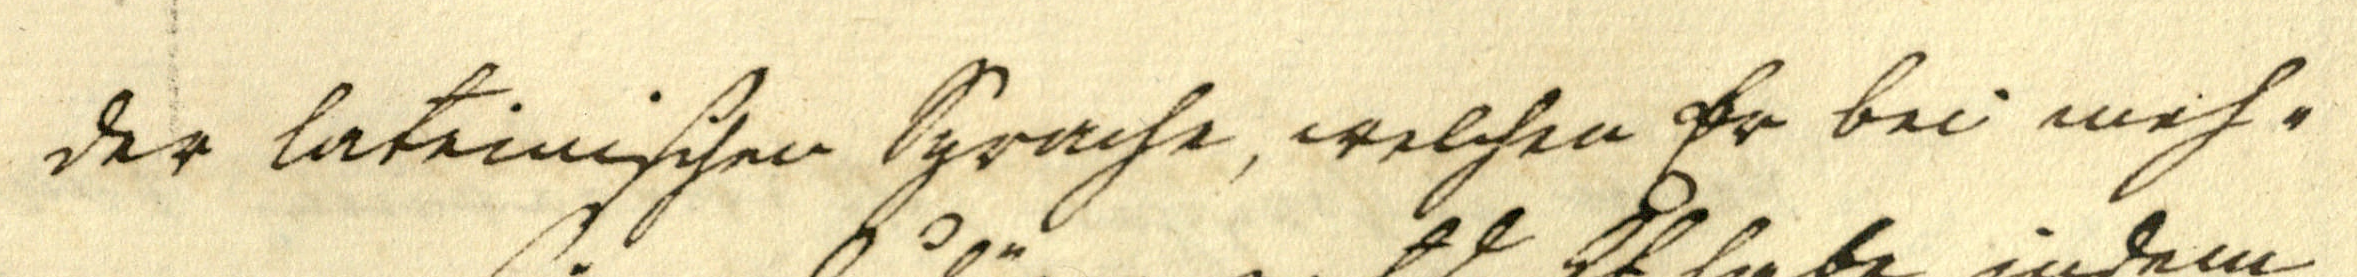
der lateinischen Sprache, welchen Er bei meh¬
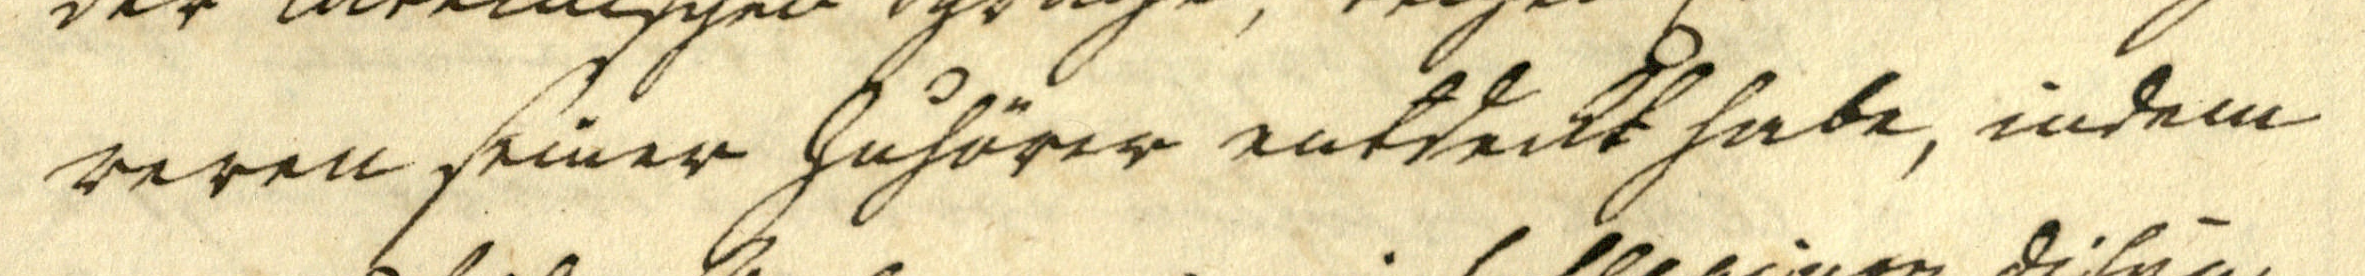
reren seiner Zuhörer entdeckt habe, indem
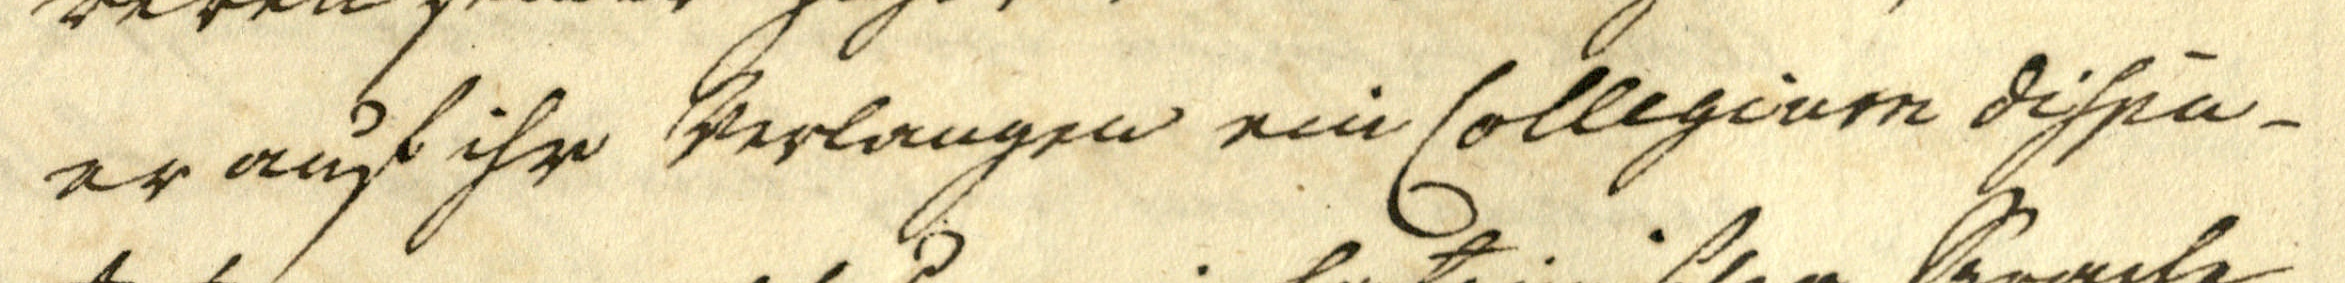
er auf ihr Verlangen ein Collegium dispu¬
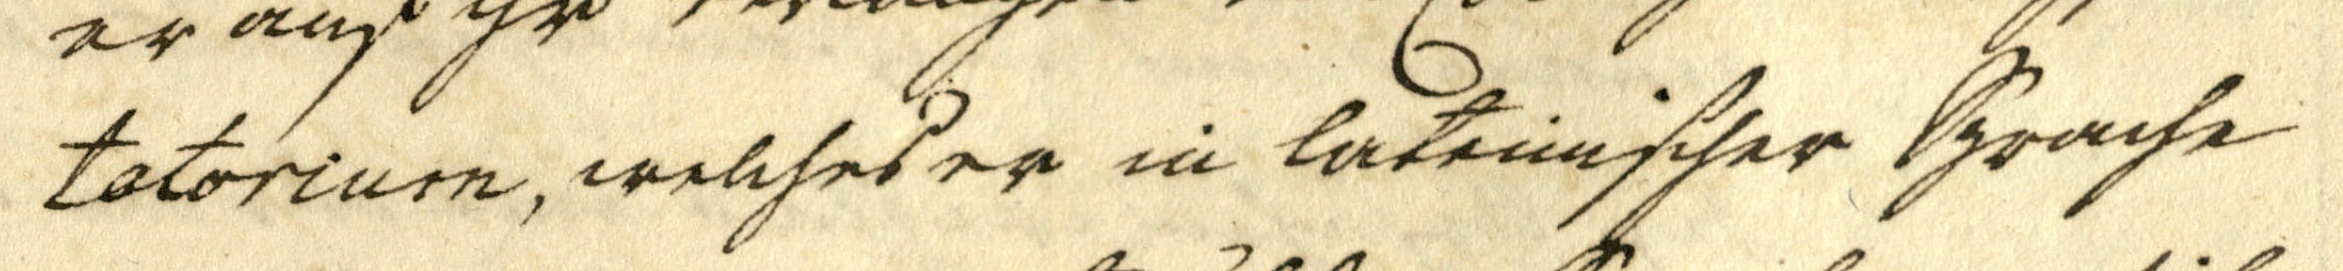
tatorium, welches er in lateinischer Sprache
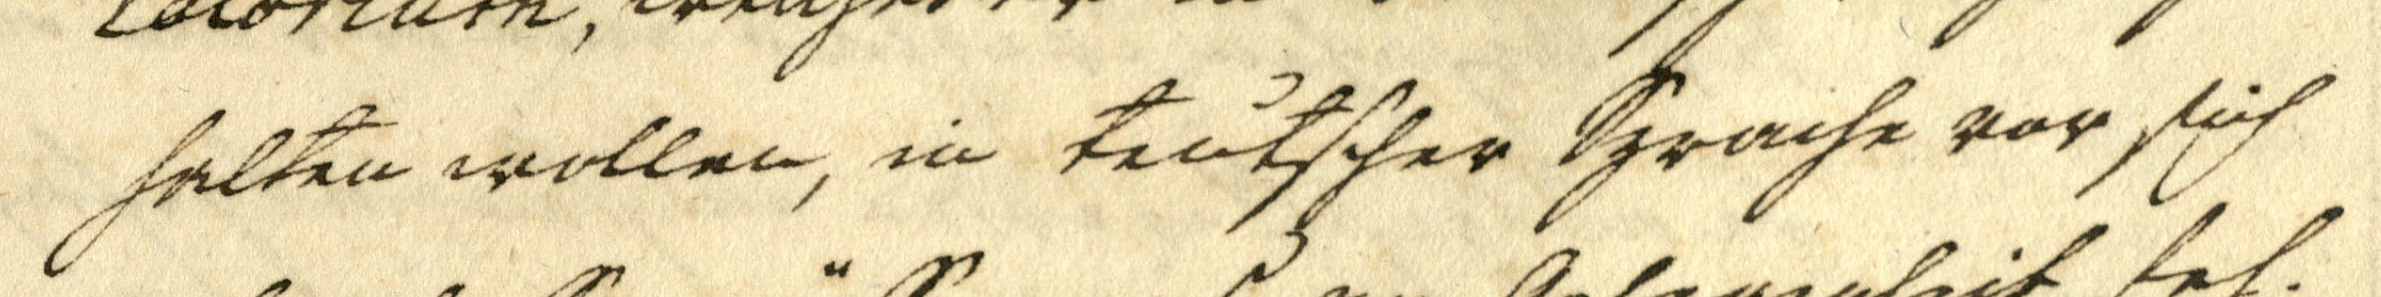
halten wollen, in teutscher Sprache vor sich
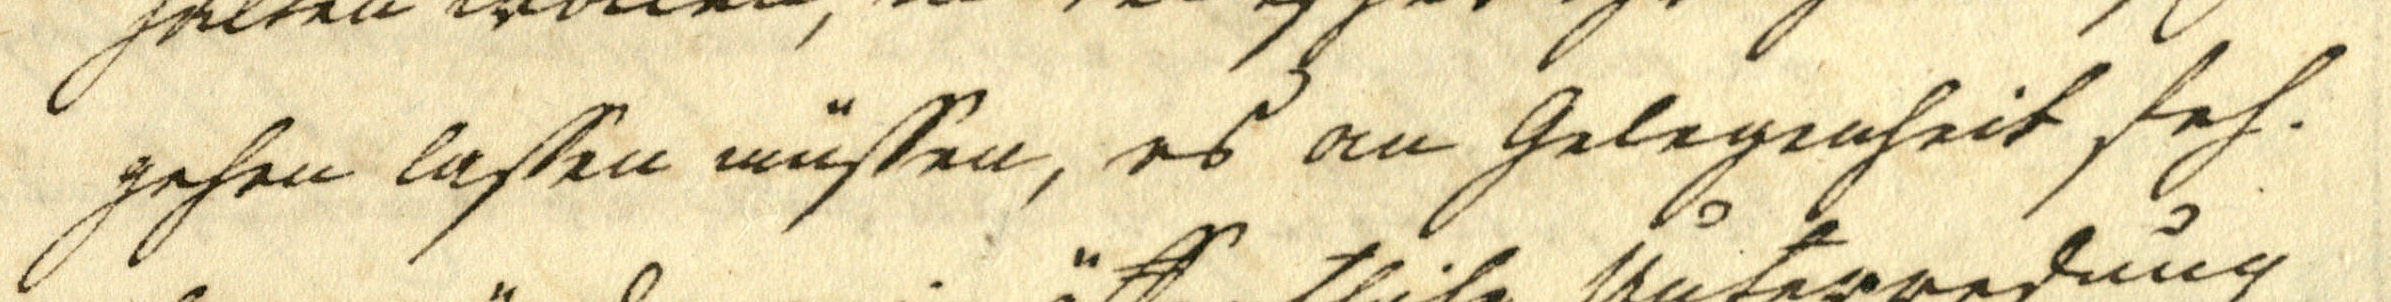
gehen lassen müssen, es an Gelegenheit feh¬
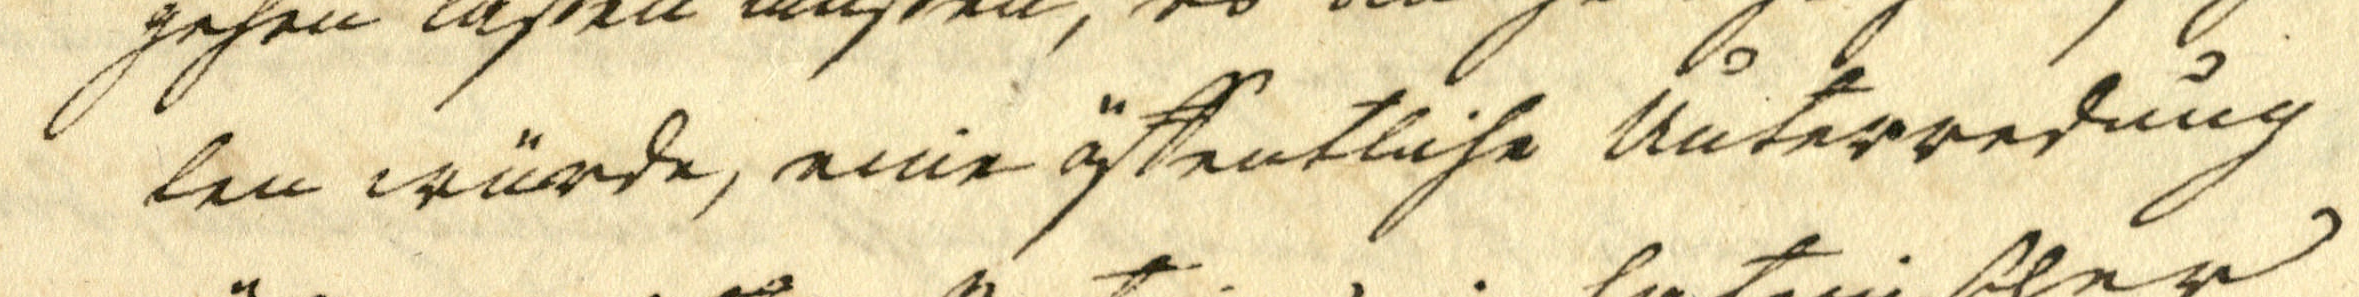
len würde, eine öffentliche Unterredung
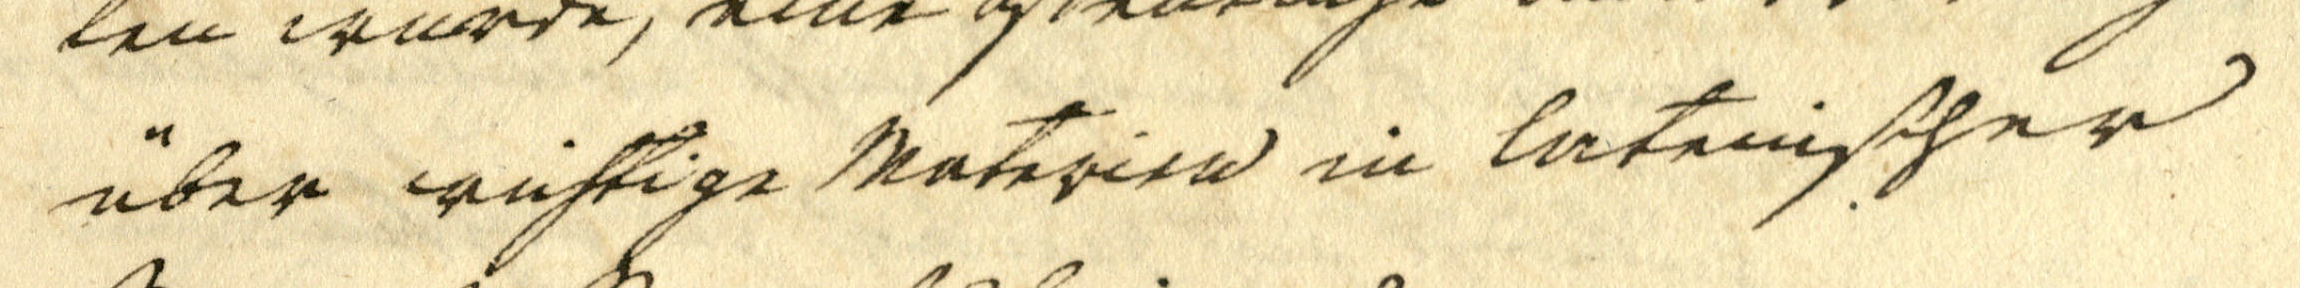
über wichtige Materien in lateinischer
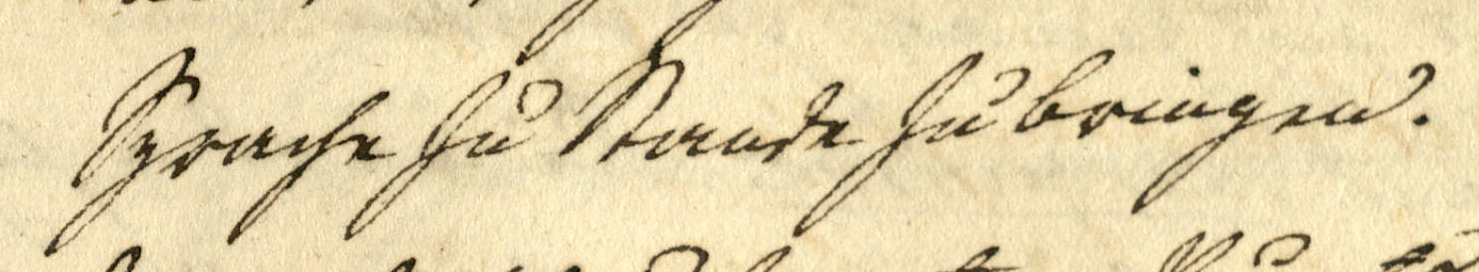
Sprache zu Stande zu bringen.
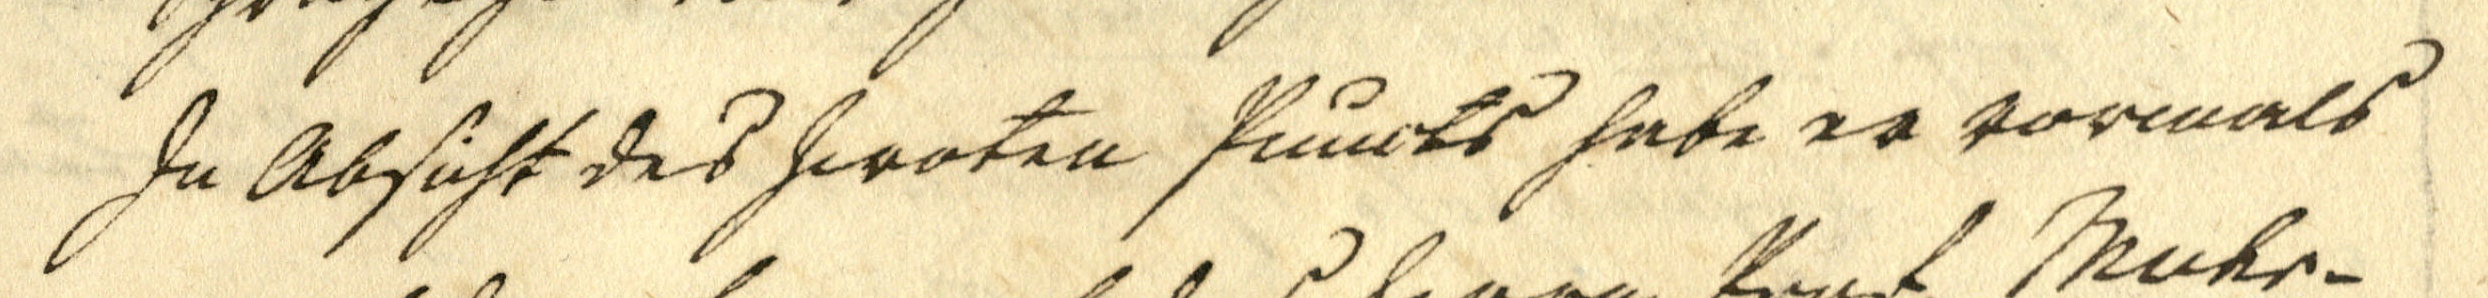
In Absicht des zwoten Puncts habe er vormals
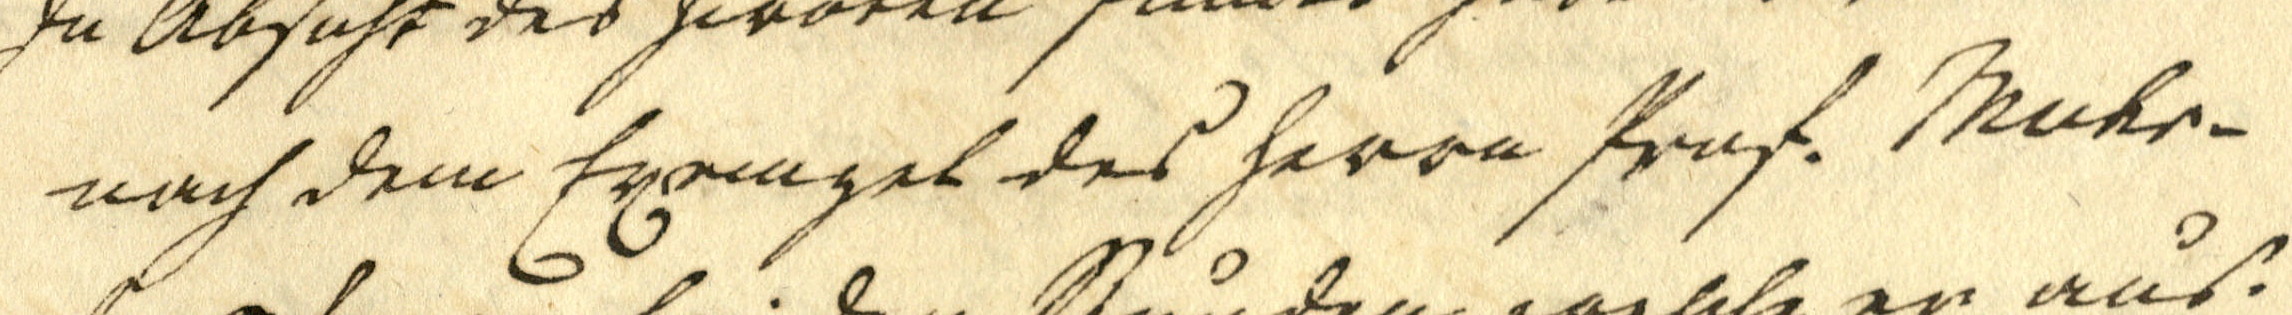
nach dem Exempel des Herrn Prof. Muhr¬
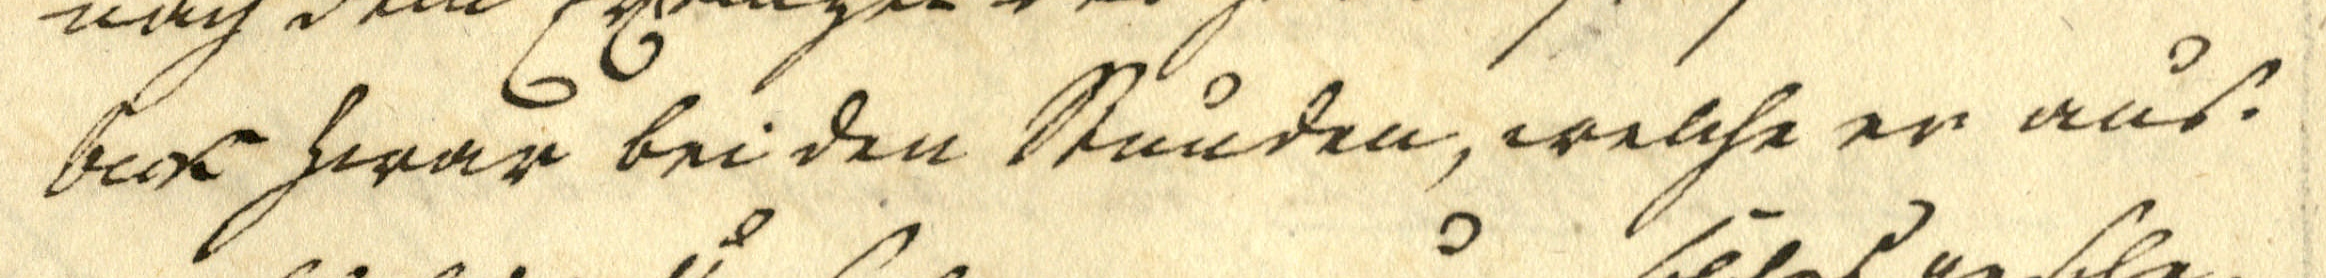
beck zwar bei den Stunden, welche er aus¬
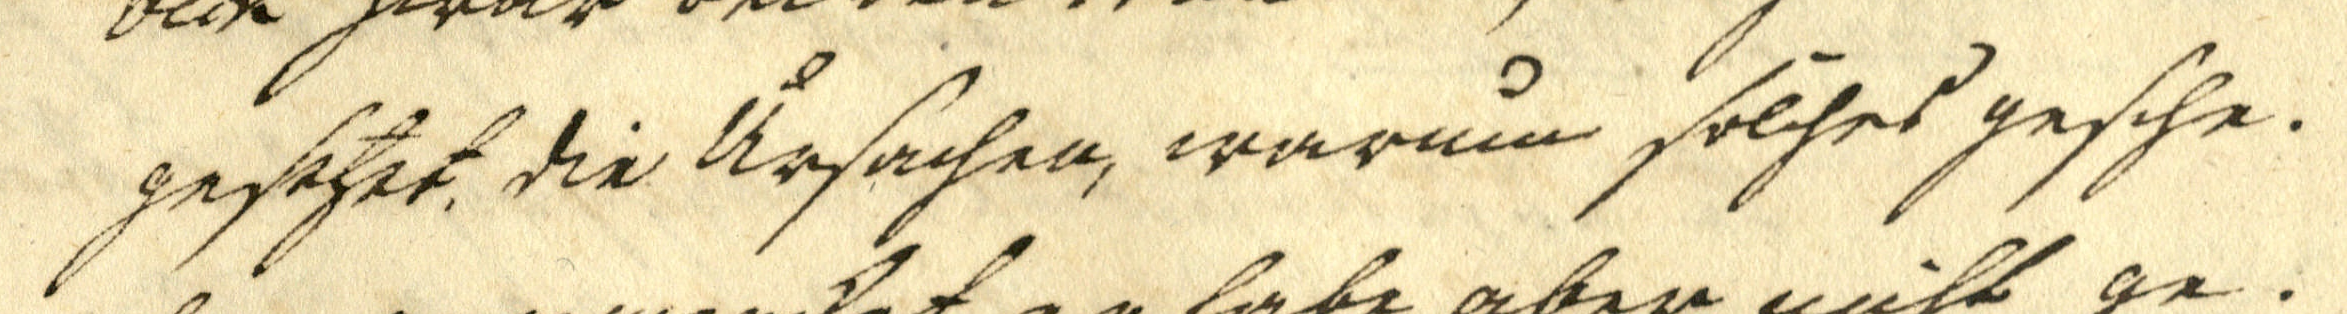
gesetzet, die Ursachen, warum solches gesche¬
